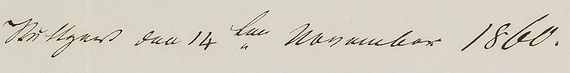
Stuttgart den 14ten November 1860.
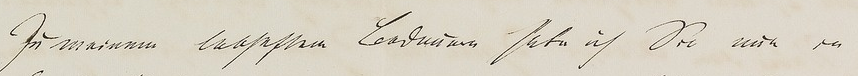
Zu meinem lebhaften Bedauern habe ich Sie nun in
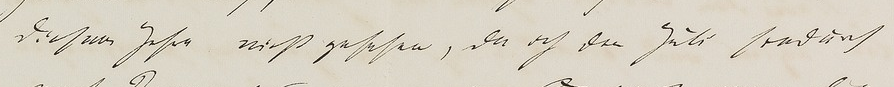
diesem Jahre nicht gesehen, da ich den Juli hindurch
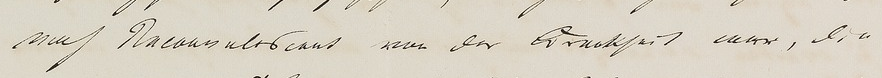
noch Reconvalescent von der Krankheit war, die
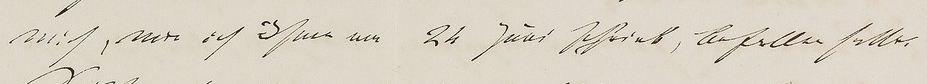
mich, wie ich Ihnen am 2t Juni schrieb, befallen hatte.
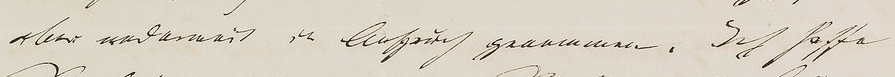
aber anderweit in Anspruch genommen. Ich hoffe
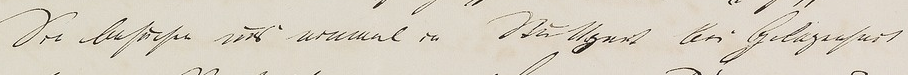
Sie besuchen uns einmal in Stuttgart bei Gelegenheit
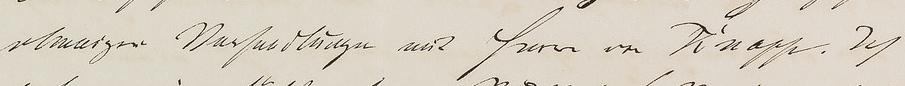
etwaiger Verhandlungen mit Herrn von Knapp. Ich
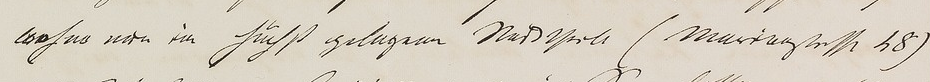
wohne nun im höchst gelegenen Stadttheile (Marienstrasse 48)
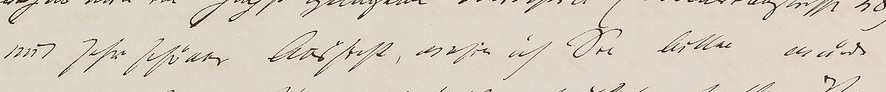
mit sehr schöner Aussicht, wohin ich Sie bitten würde
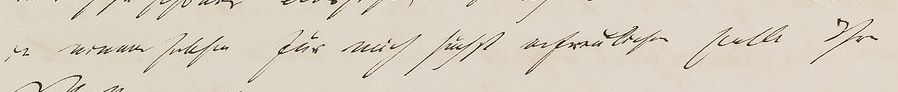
in einem solchen für mich höchst erfreulichen Falle Ihre
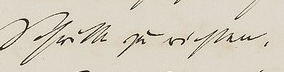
Schritte zu richten.
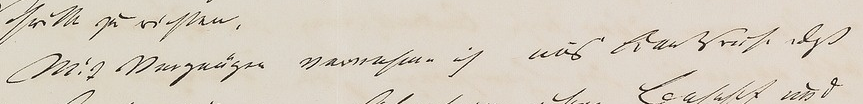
Mit Vergnügen vernehme ich aus Karlsruhe daß
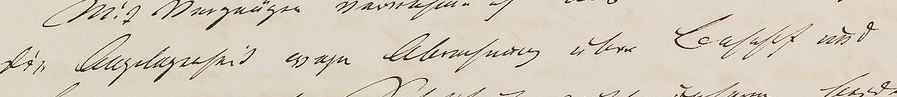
die Angelegenheit wegen Abrechnung über Bahnhof und
